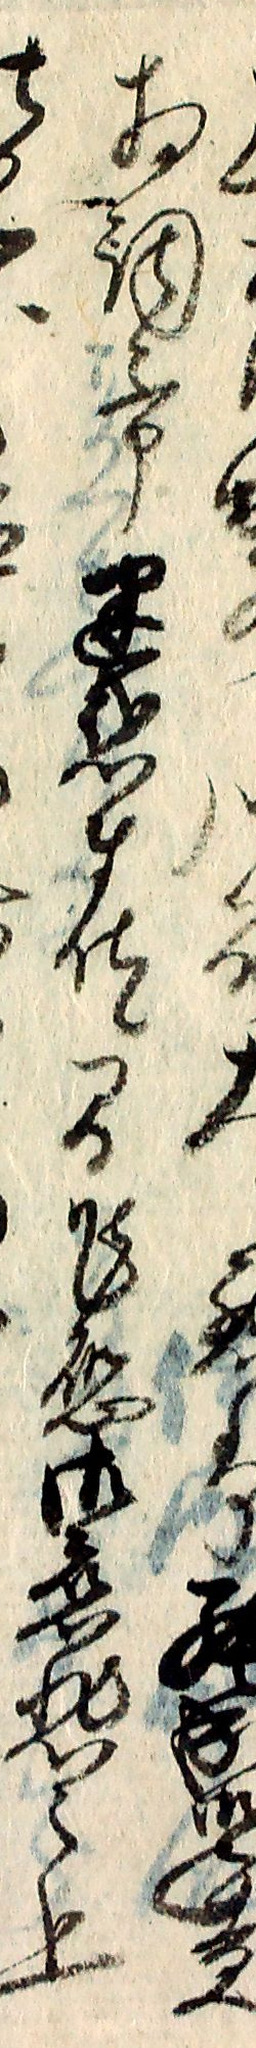相調不申迷惑奉仕候間乍恐御慈悲之上
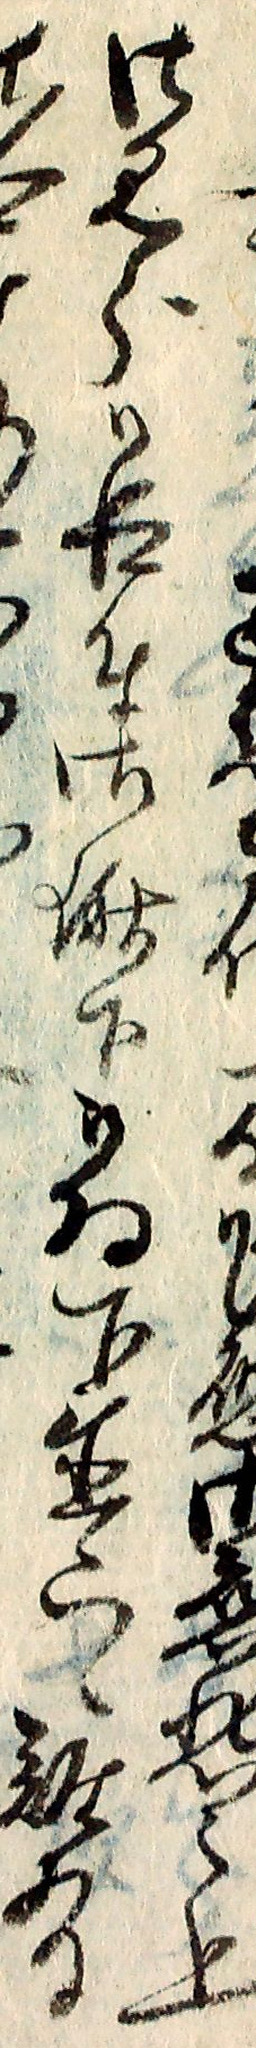御見分被仰付御鍬下被為下置候はゝ難有
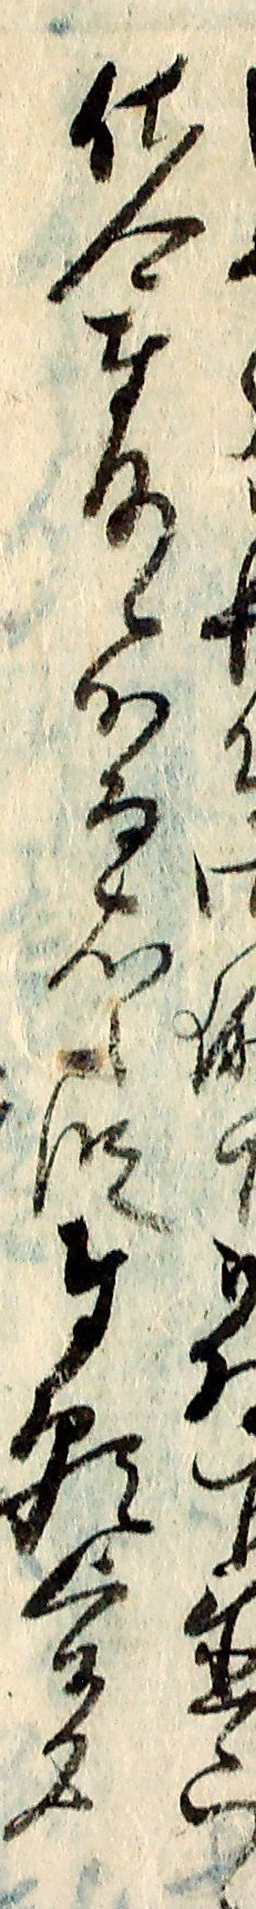仕合奉存候仍て右之段奉願上候以上
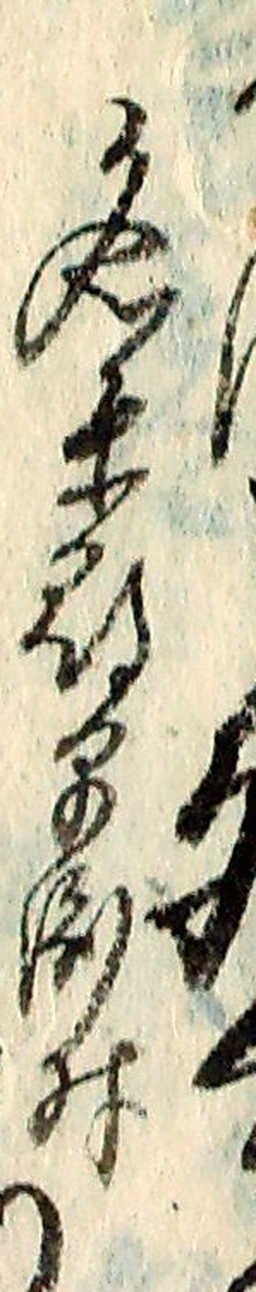名東郡早淵村
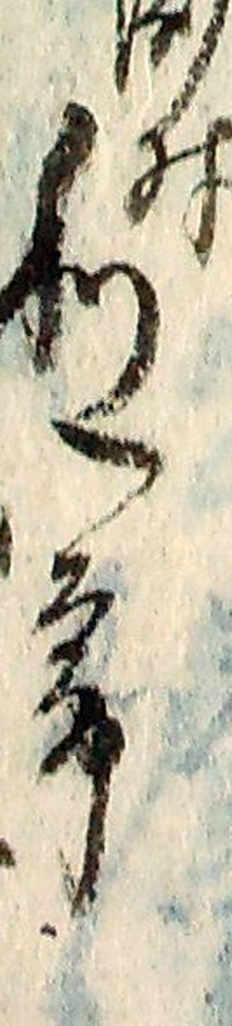利八郎
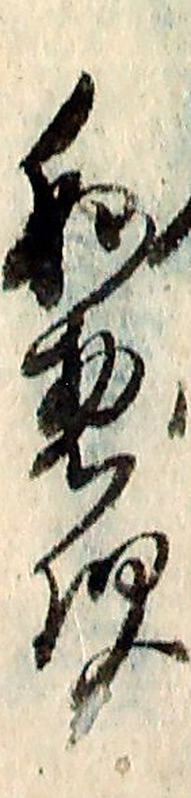利惣次
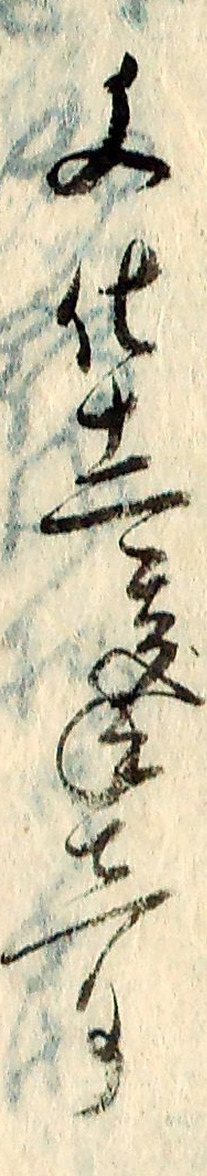文化十二亥年十一月
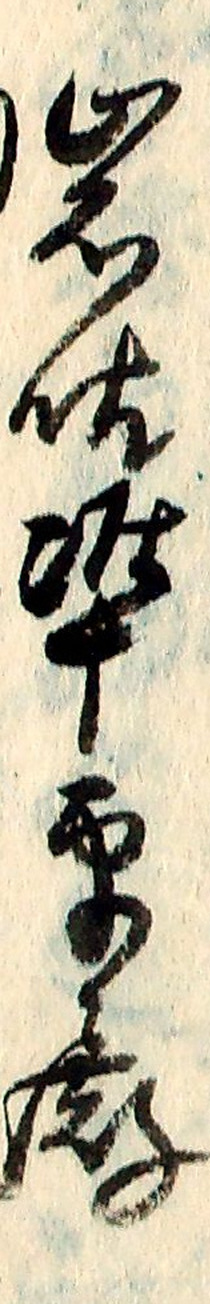岩佐準平殿
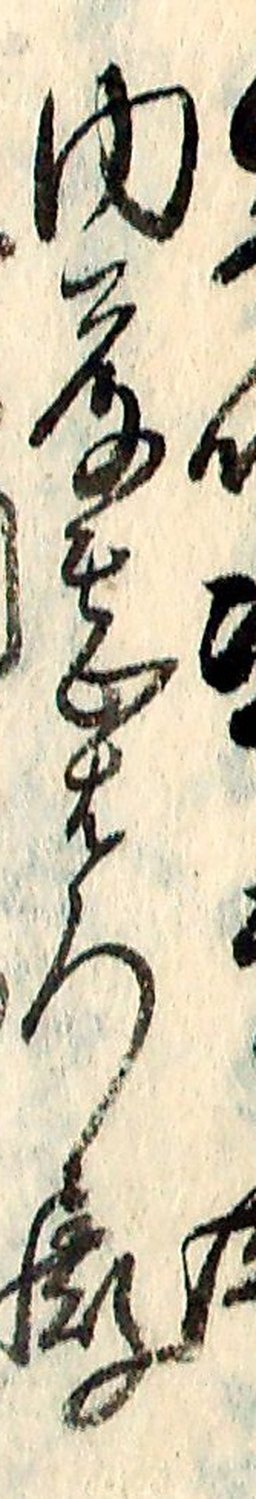内藤甚右衛門殿
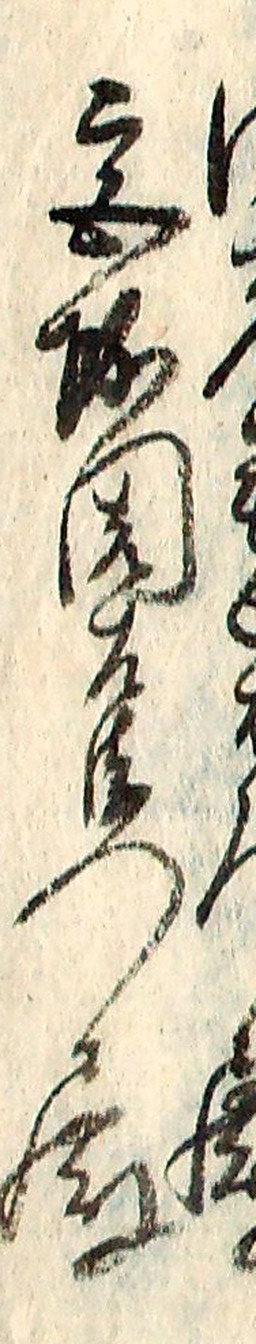宮城周左衛門殿

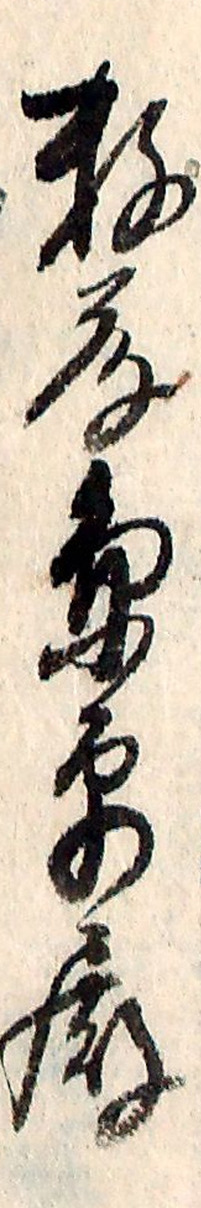数藤円平殿
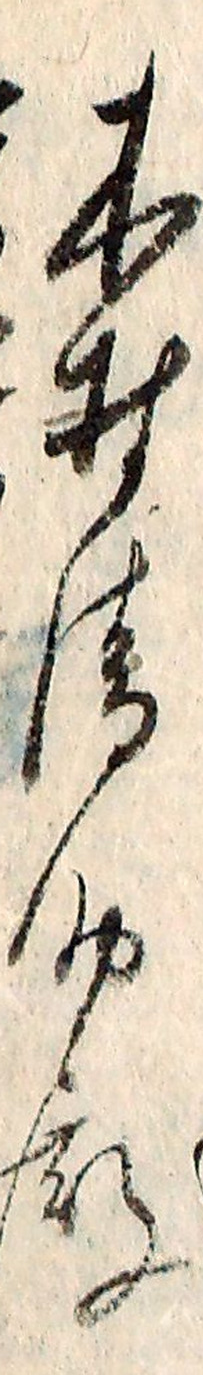木村清助殿
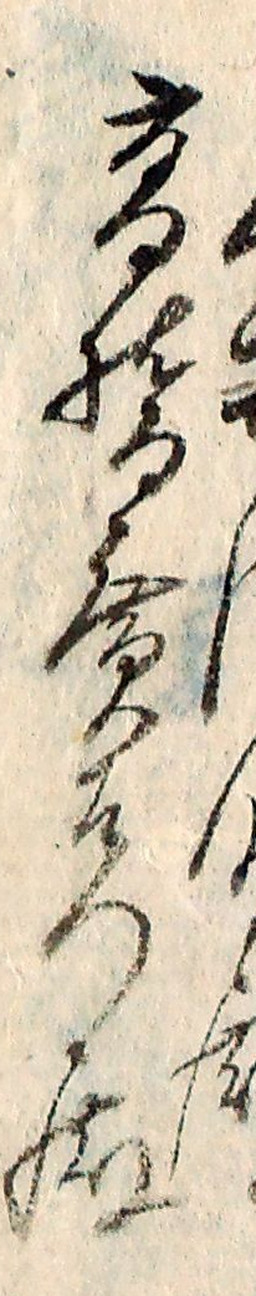高橋広左衛門殿
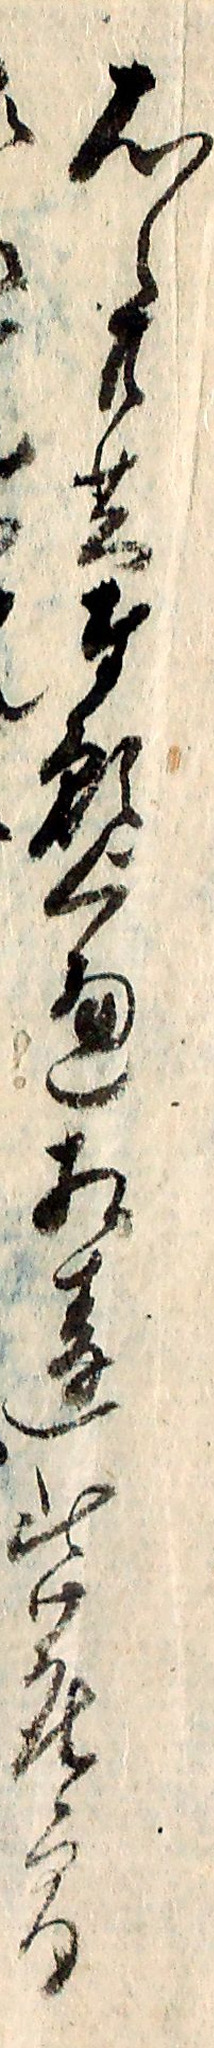右之共共奉願上通相違無御座候間
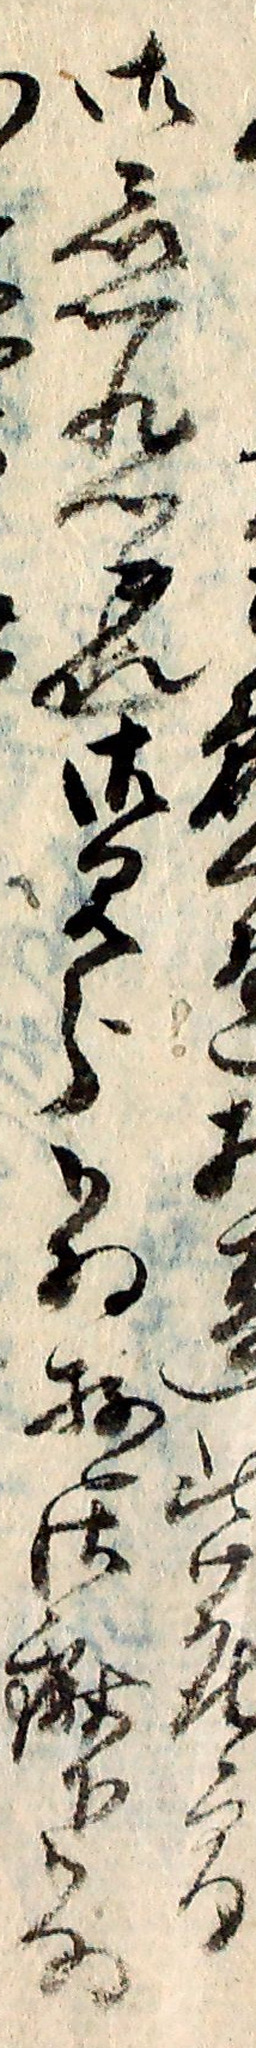御慈悲を以御見分被為遊御鍬下被為
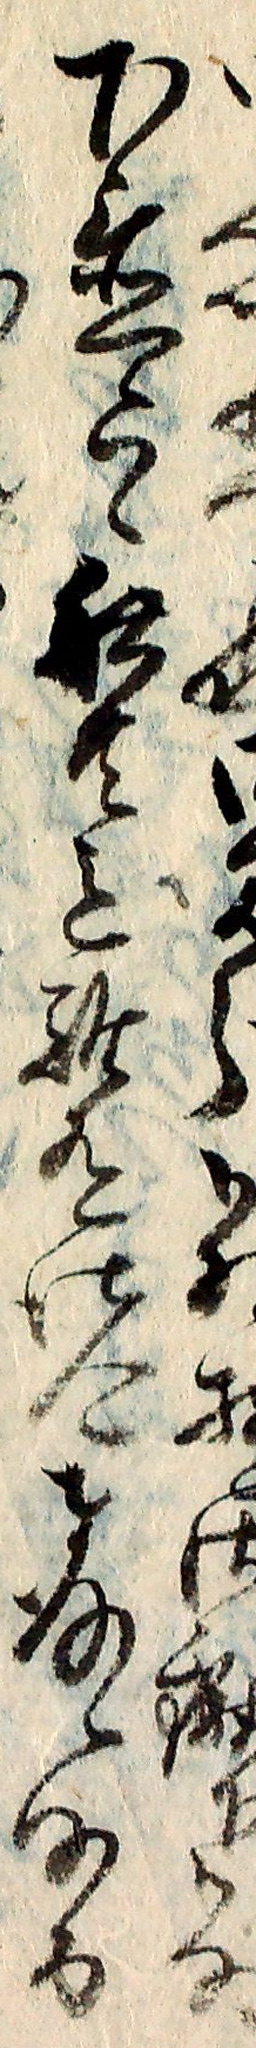下置候はゝ私共迄難有仕合奉存候仍て
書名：諸御願書控(後藤氏壱番）
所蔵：鳴門教育大学 Naruto University of Education
